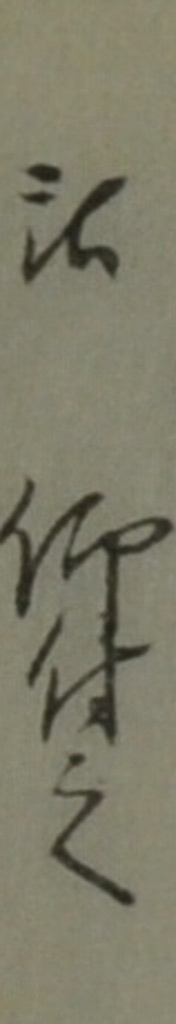被仰付之
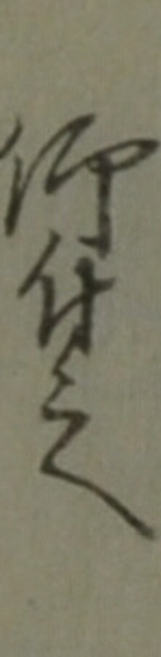仰付之
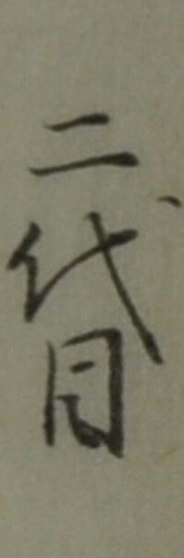二代目
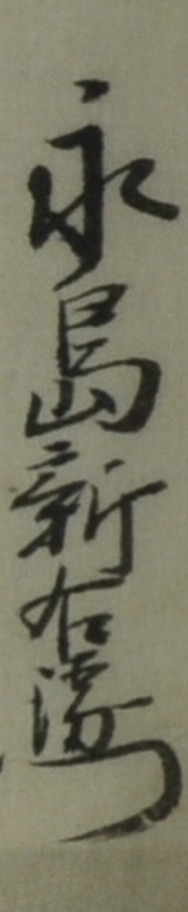永島新右衛門

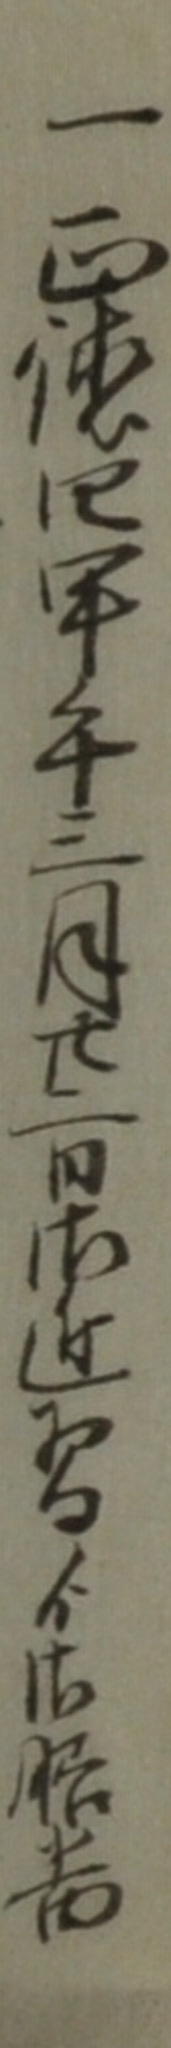一正徳四甲午三月廿二日御近習ゟ御膳番
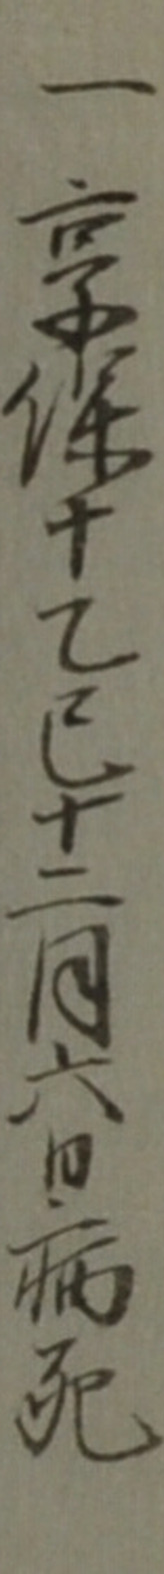一享保十乙巳十二月六日病死
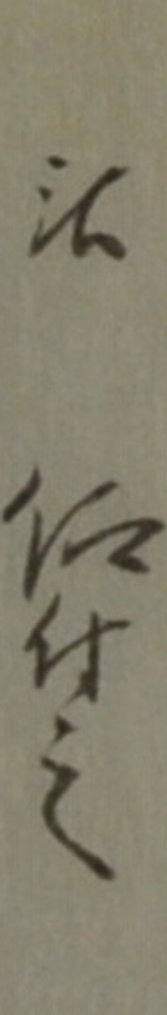被仰付之
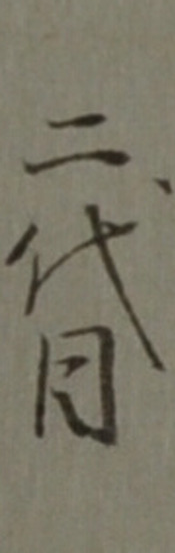二代目
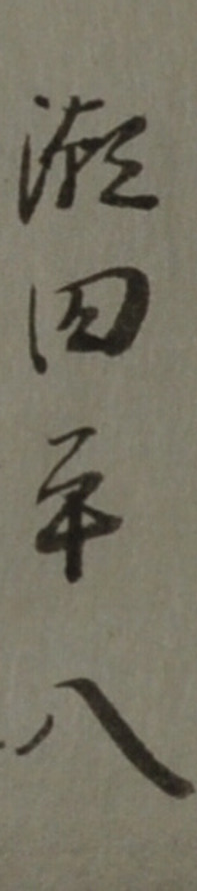瀬田平八
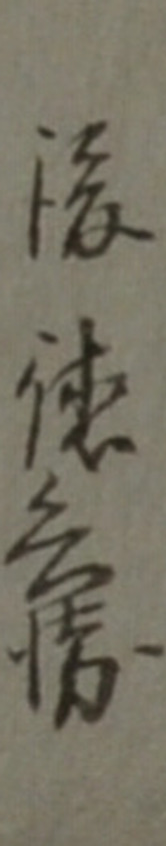後徳兵衛
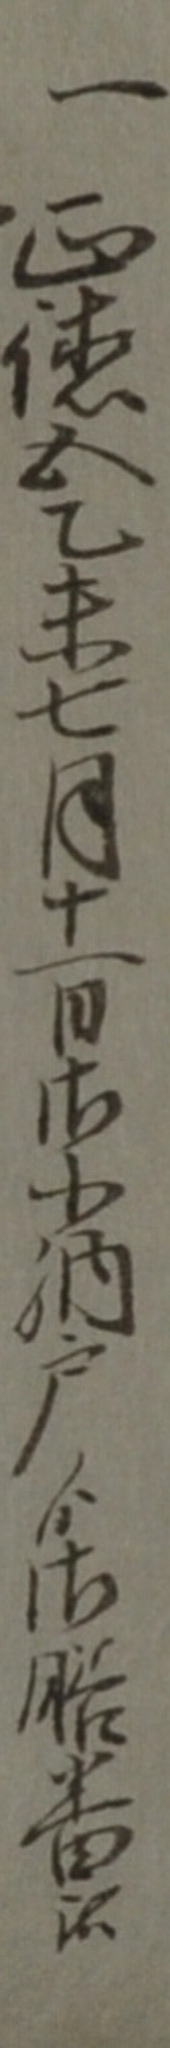一正徳五乙未七月十一日御小納戸ゟ御膳番被
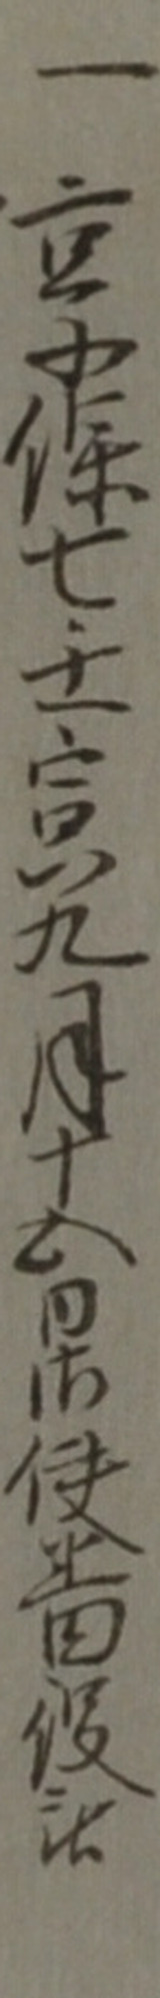一享保七壬寅九月十五日御使番役被
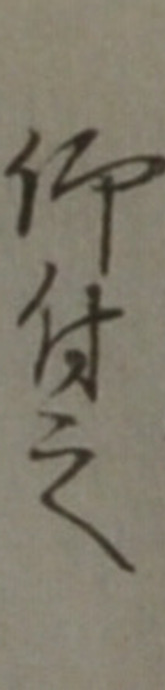仰付之
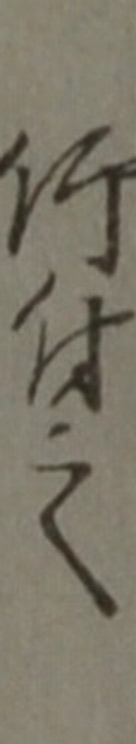仰付之
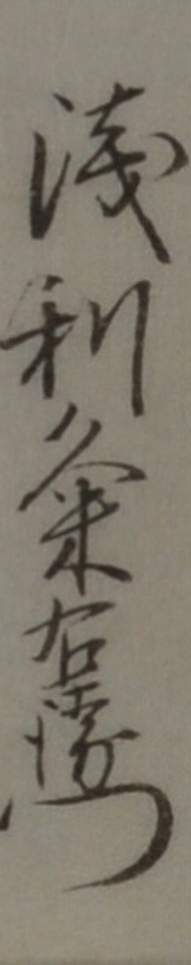浅利粂右衛門
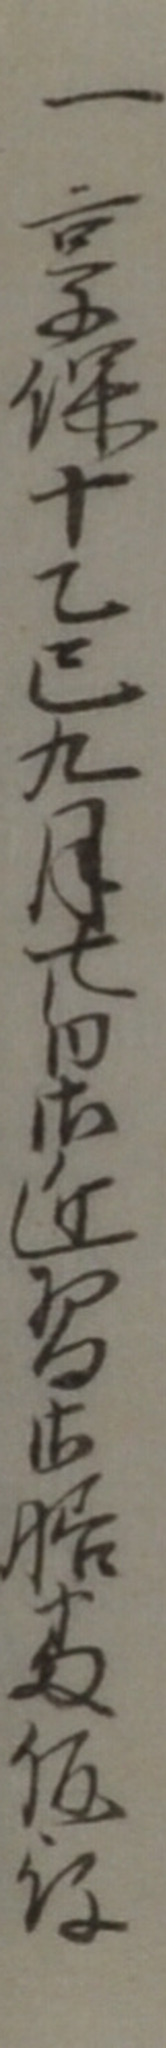一享保十乙巳九月廿日御近習御膳両仮役
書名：諸御役代々録（四）
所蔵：伊那市立高遠町図書館・合同会社AMANE
